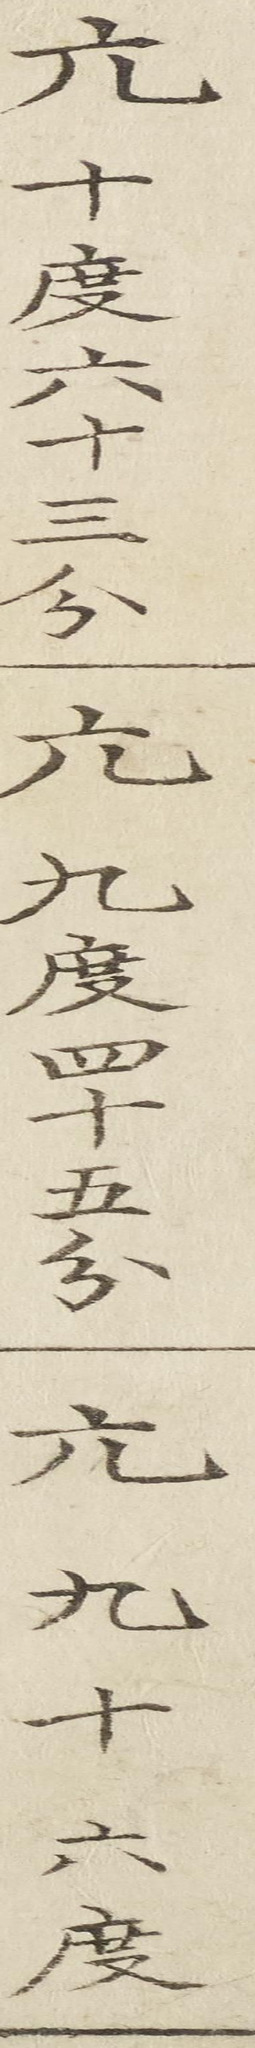亢十度六十三分亢九度四十五分亢九十六度
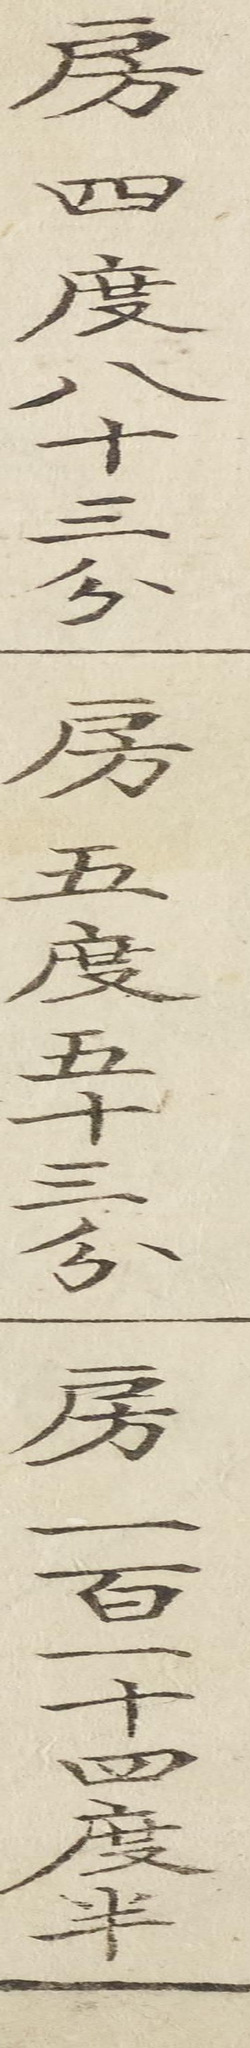房四度八十三分房五度五十三分房一百一十四度半
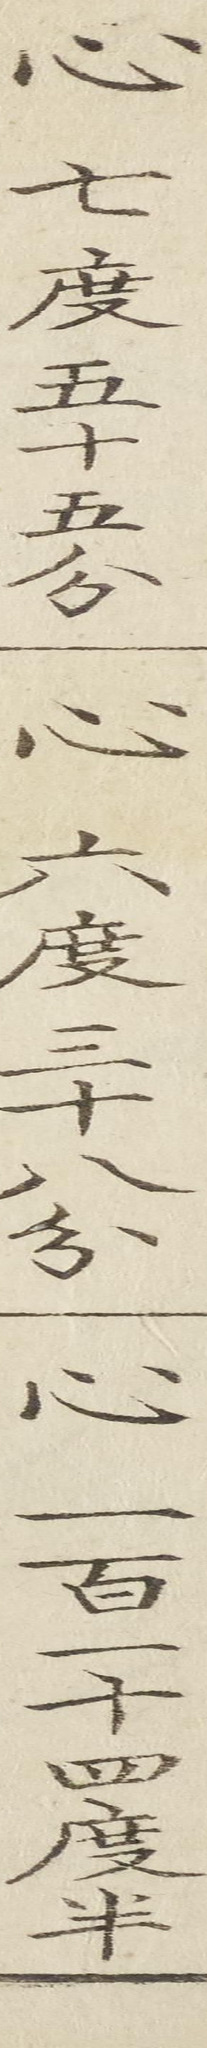心七度五十五分心六度三十八分心一百一十四度半
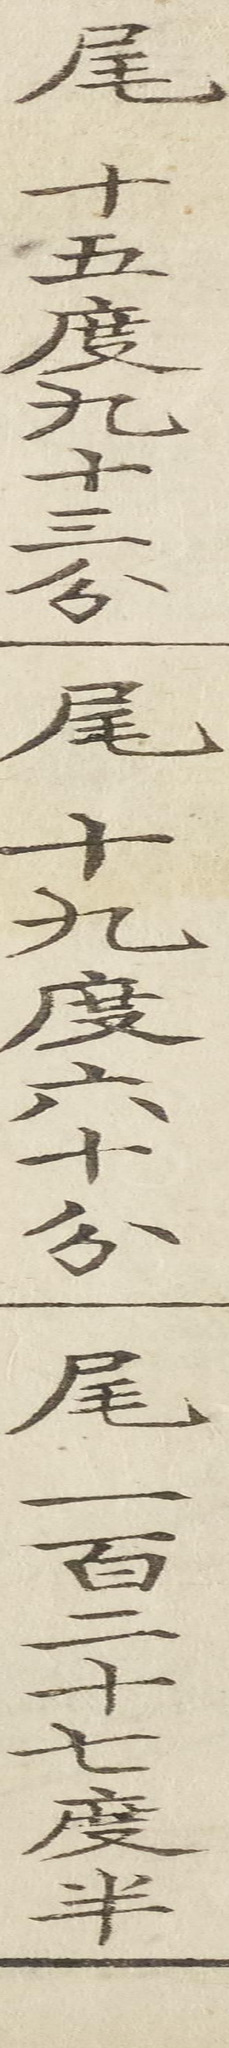尾十五度九十三分尾十九度六十分尾一百二十七度半
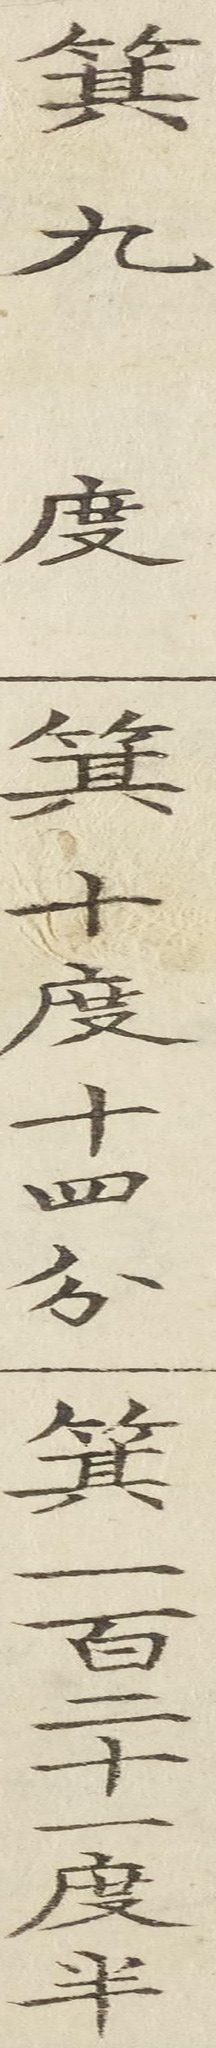箕九度箕十度十四分箕一百二十一度半
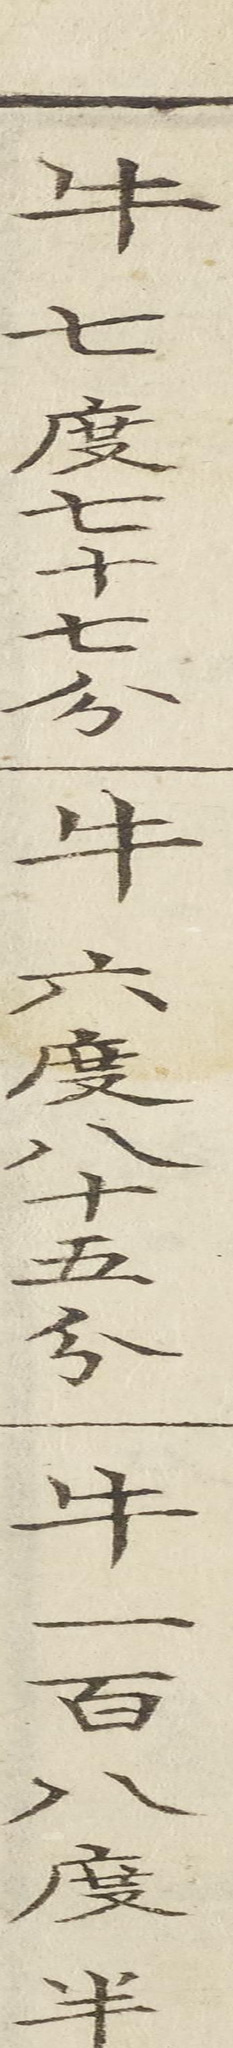牛七度七十七分牛六度八十五分牛一百八度半
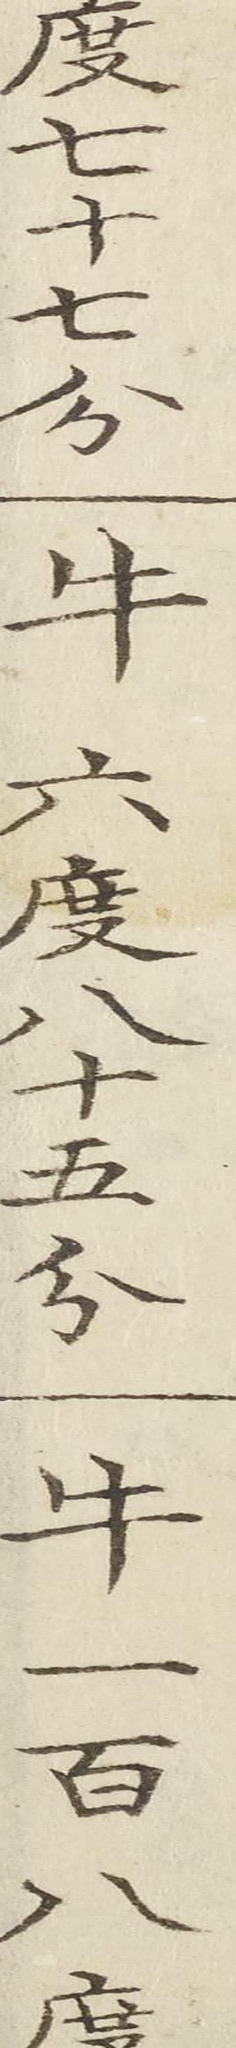牛七度七十七分牛六度八十五分牛一百八度半
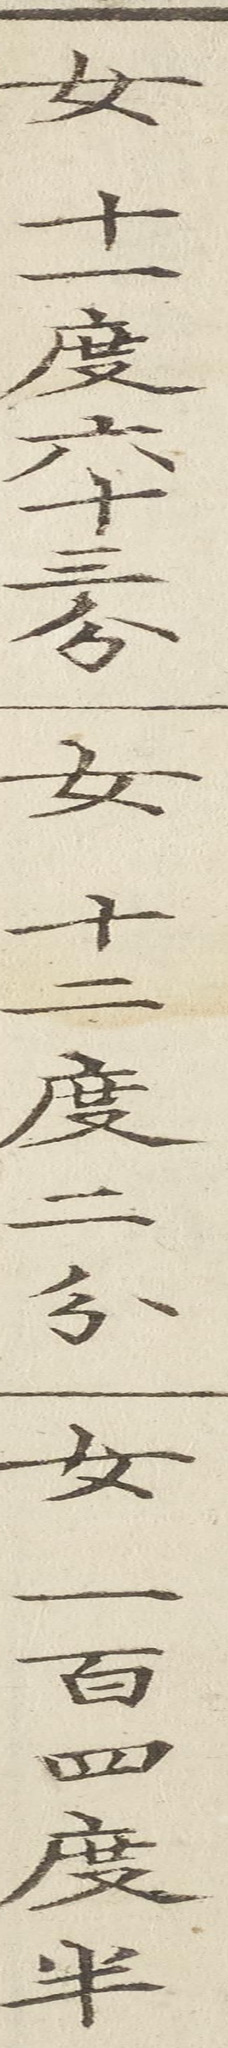女十一度六十三分女十二度二分女一百四度半
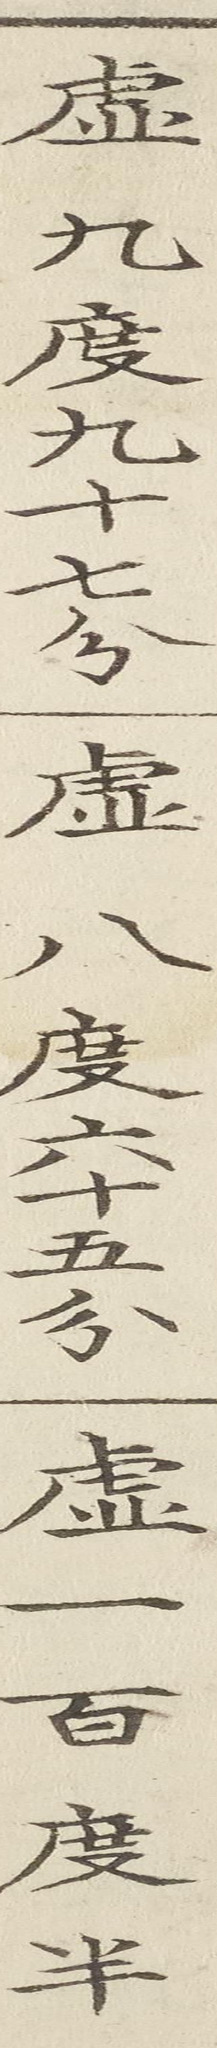虚九度九十七分虚八度六十五分虚一百度半
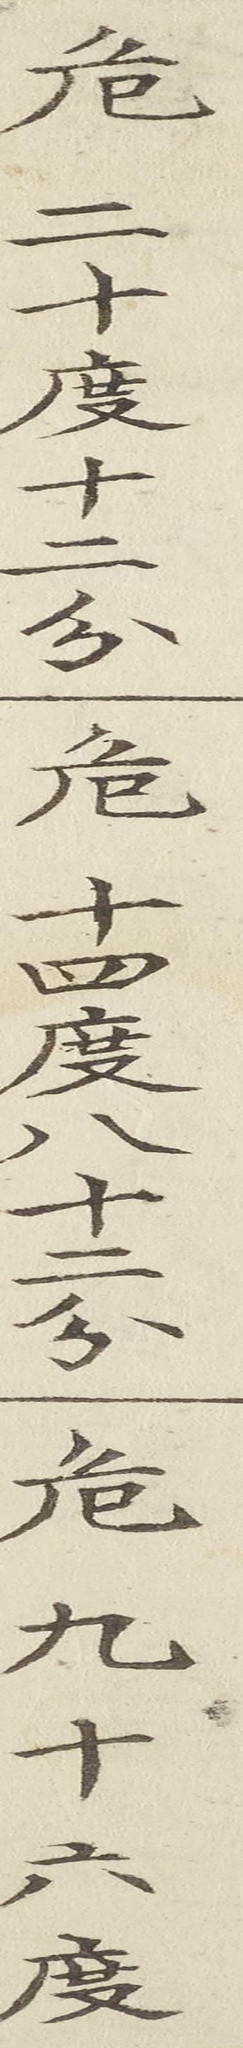危二十度十二分危十四度八十二分危九十六度
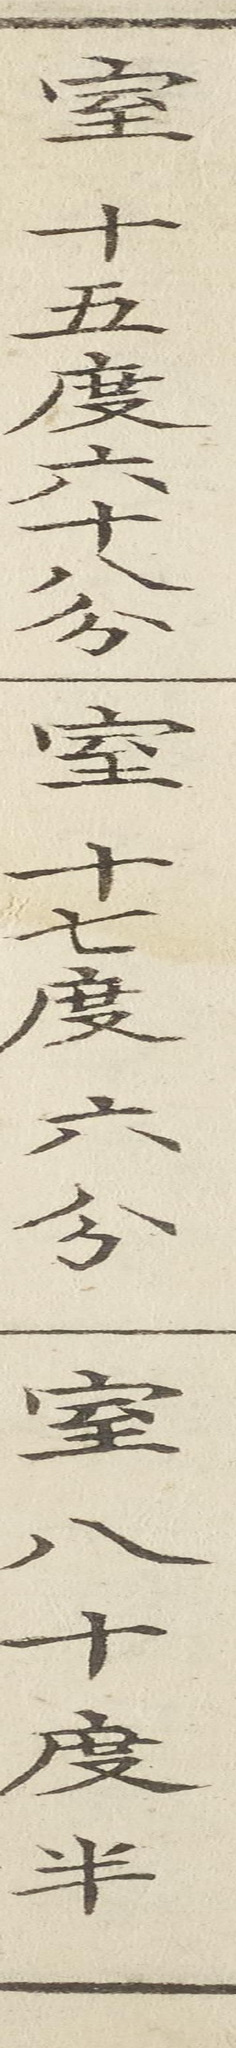室十五度六十八分室十七度六分室八十度半
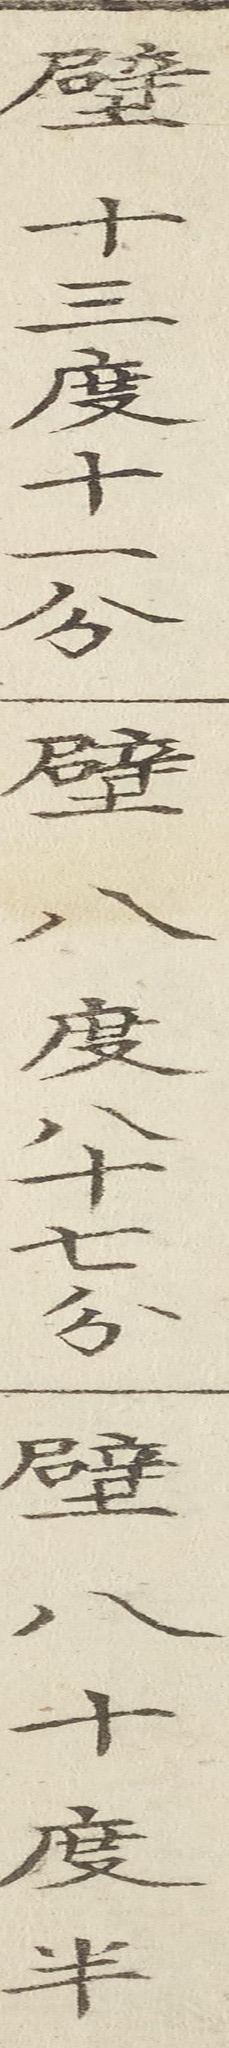壁十三度十一分壁八度八十七分壁八十度半
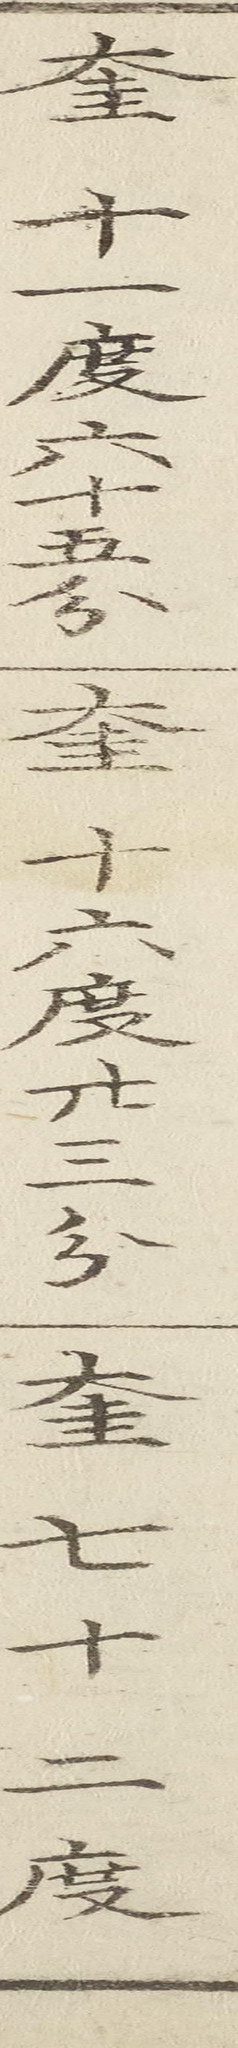奎十一度六十五分奎十六度廿三分奎七十二度
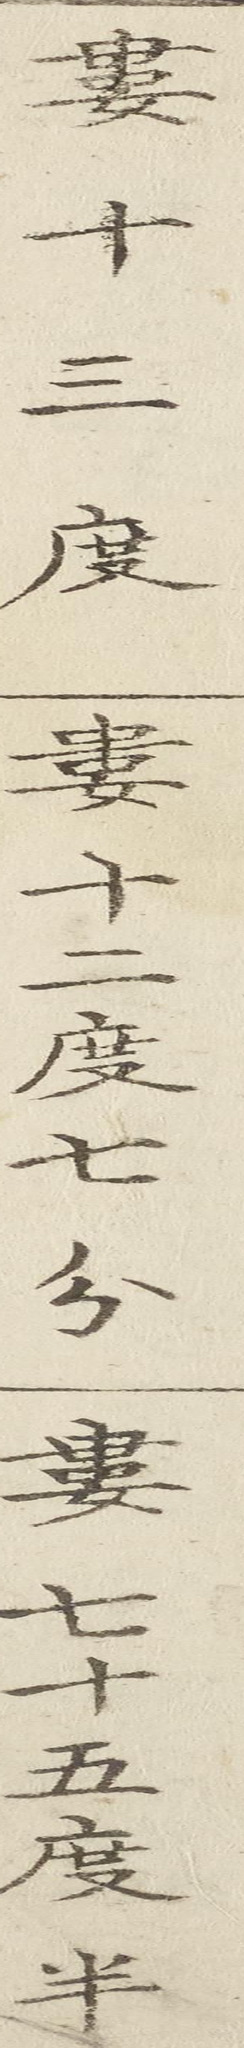婁十三度婁十二度七分婁七十五度半
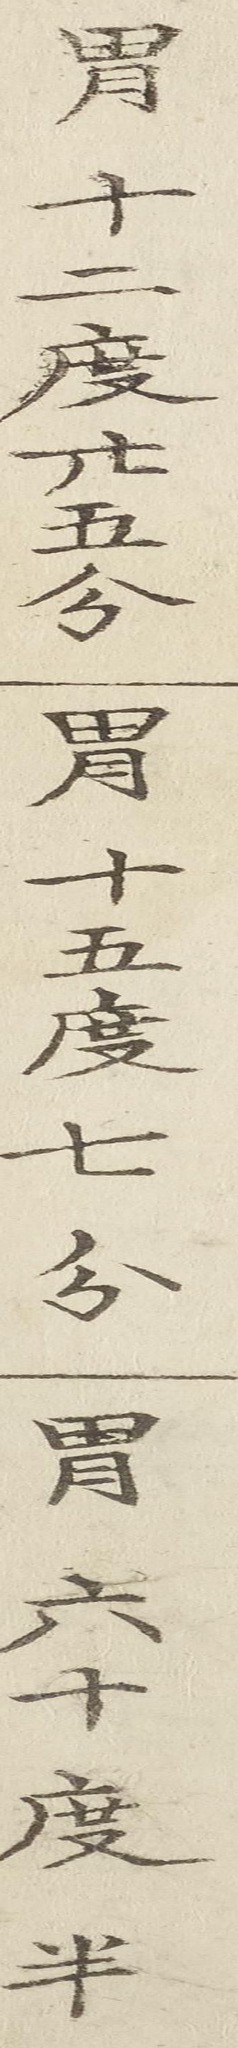胃十二度廿五分胃十五度七分胃六十度半
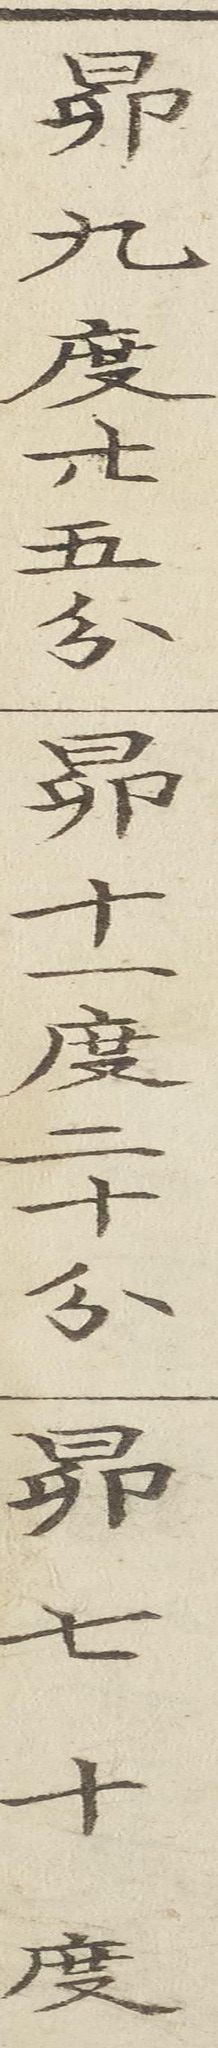昴九度廿五分昴十一度二十分昴七十度
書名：平天儀圖解
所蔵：東京大学地震研究所図書室 Earthquake Research Institute Library, The University of Tokyo, JAPAN
